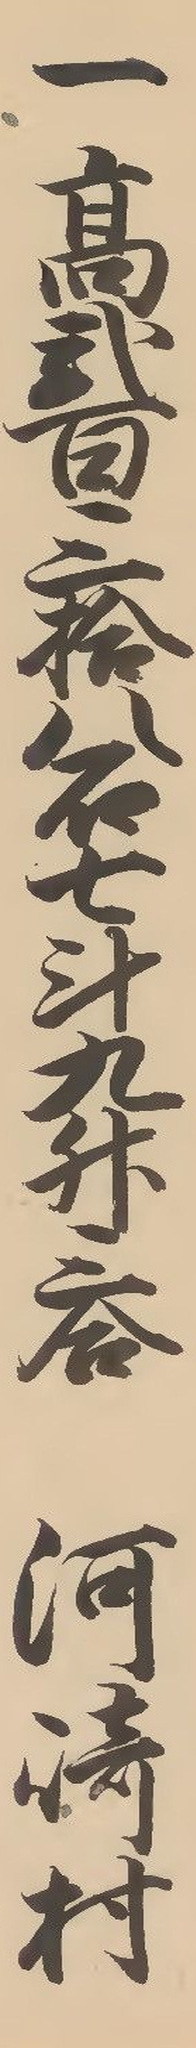一髙弐百三拾八石七斗九升三合河崎村
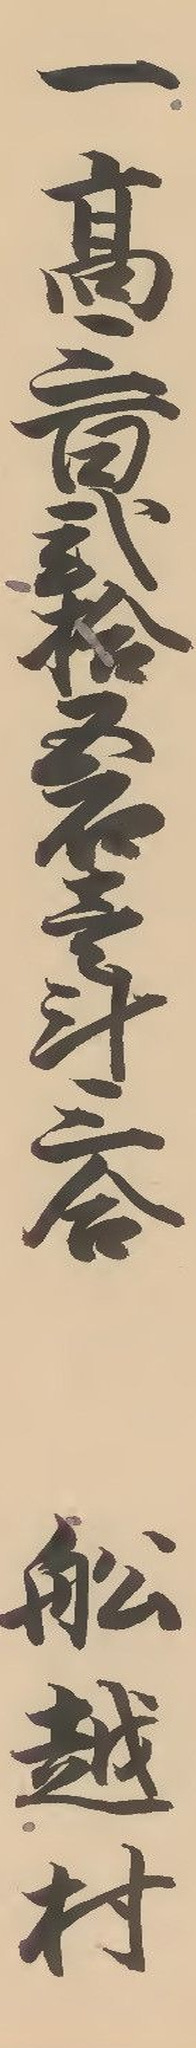一髙三百弐拾五石壱斗三合舩越村

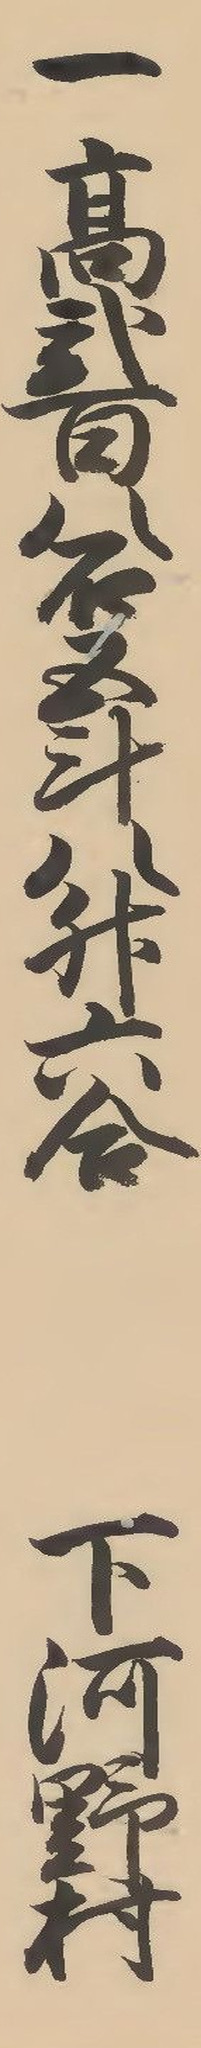一髙弐百八石五斗八升六合下河野村
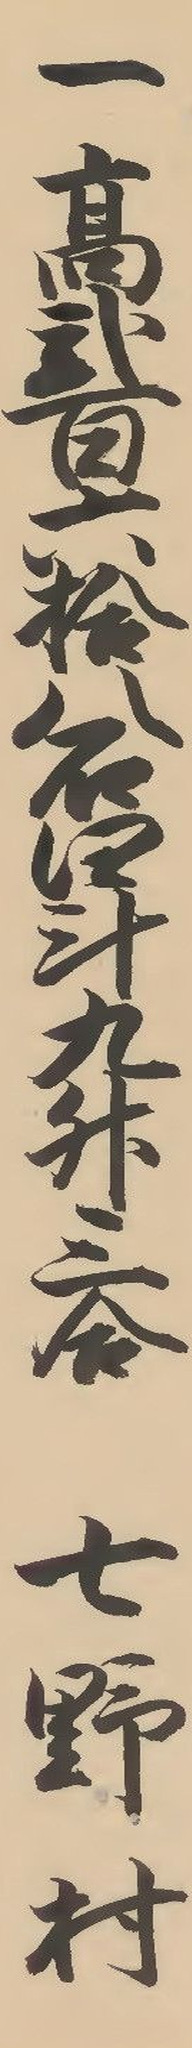一髙弐百六拾八石四斗九升三合七野村
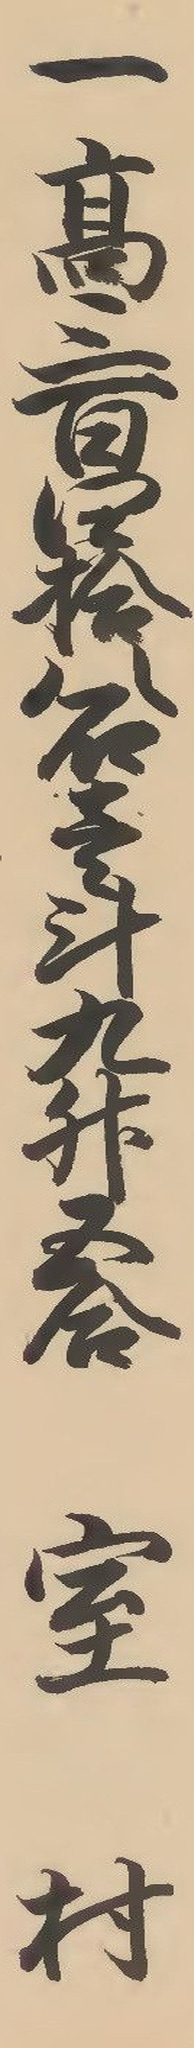一髙三百四拾八石壱斗九升五合室村
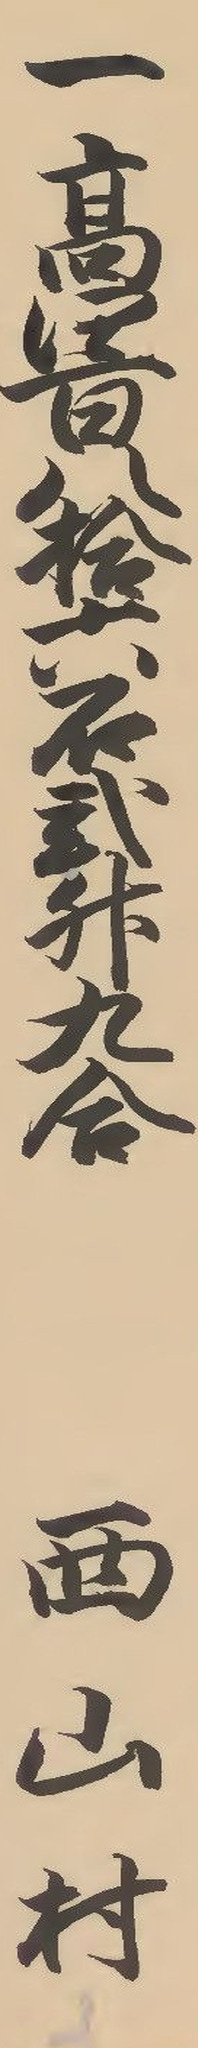一髙四百八拾六石弐升九合西山村
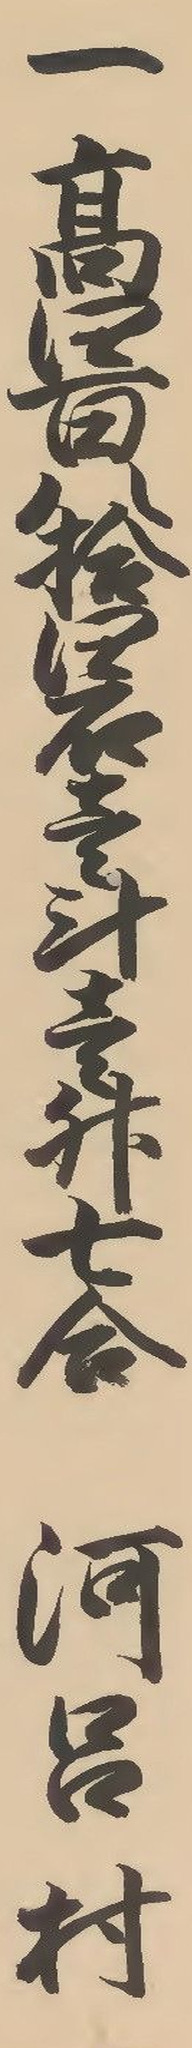一髙四百八拾四石壱斗壱升七合河呂村
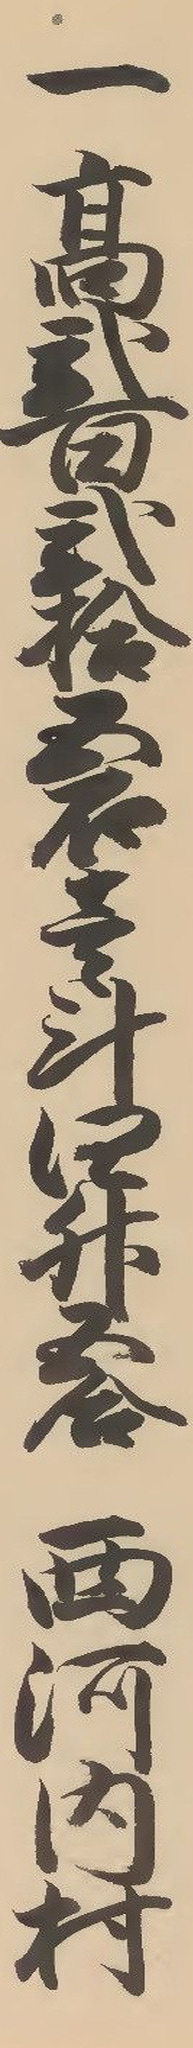一髙弐百弐拾五石壱斗四升五合西河内村
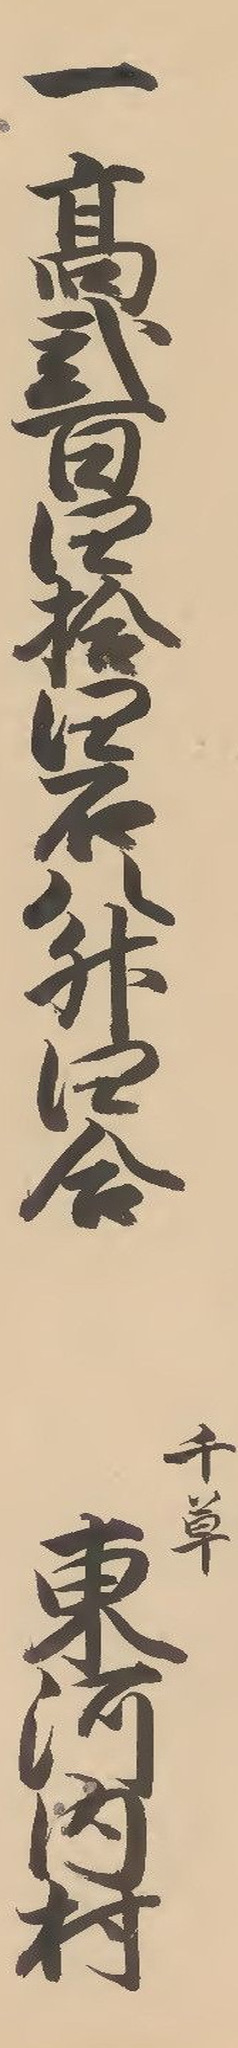一髙弐百四拾四石八升四合東河内村
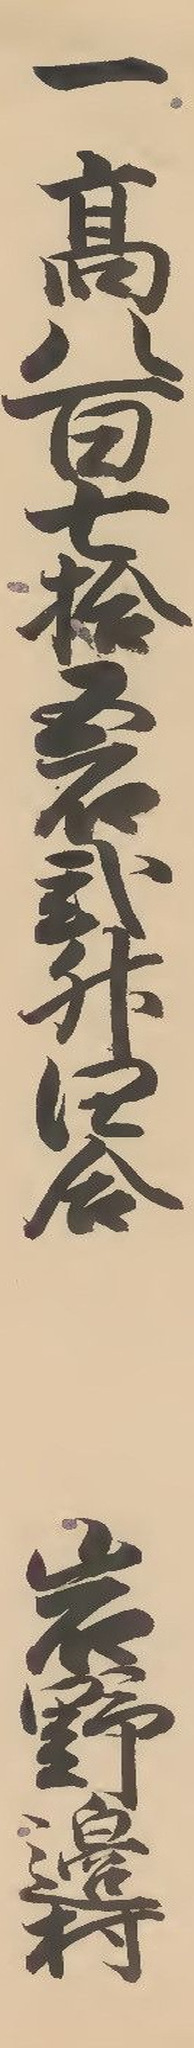一髙八百七拾五石弐升四合岩野邉村

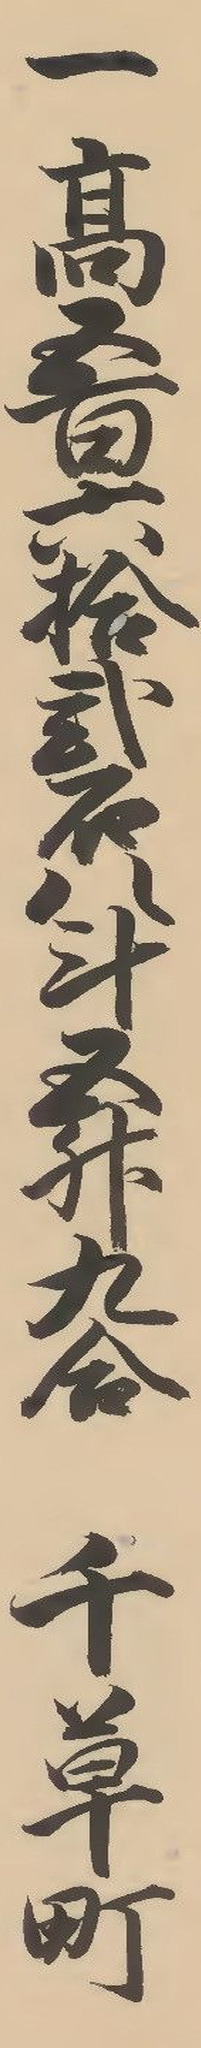一髙五百六拾弐石八斗五升九合千草町
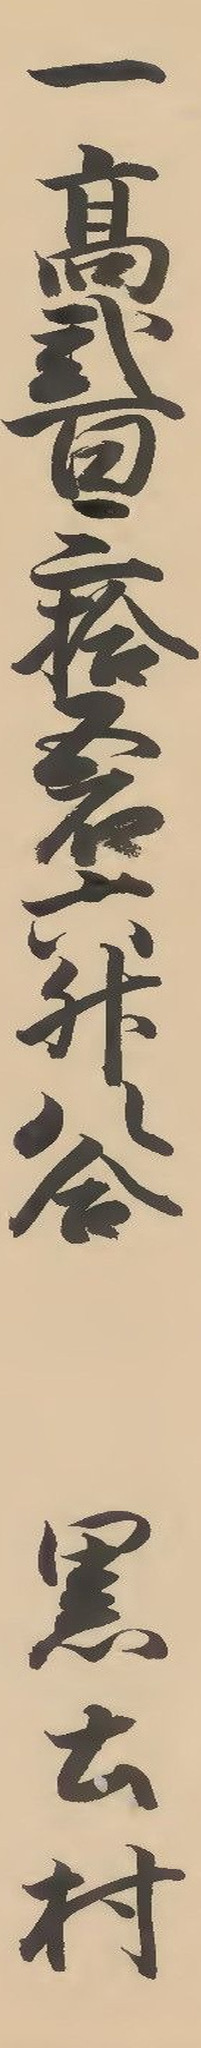一髙弐百三拾五石六升八合黑土村
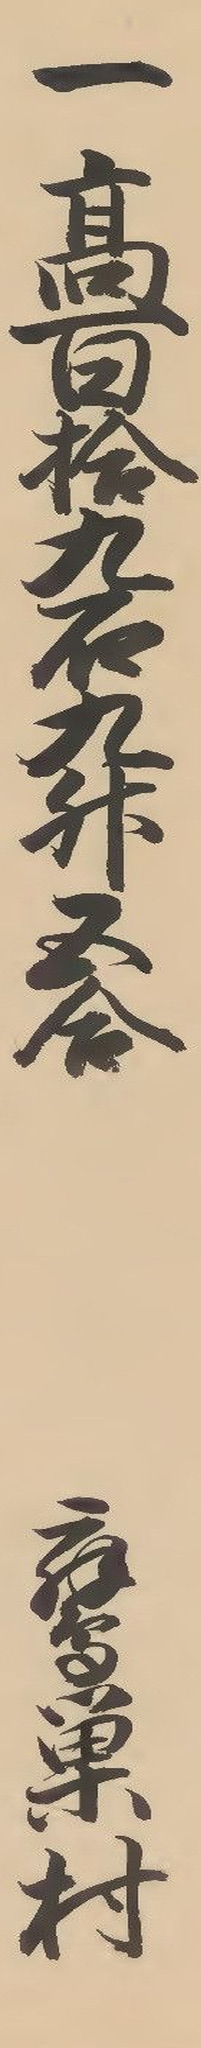一髙百拾九石九升五合鷹巣村
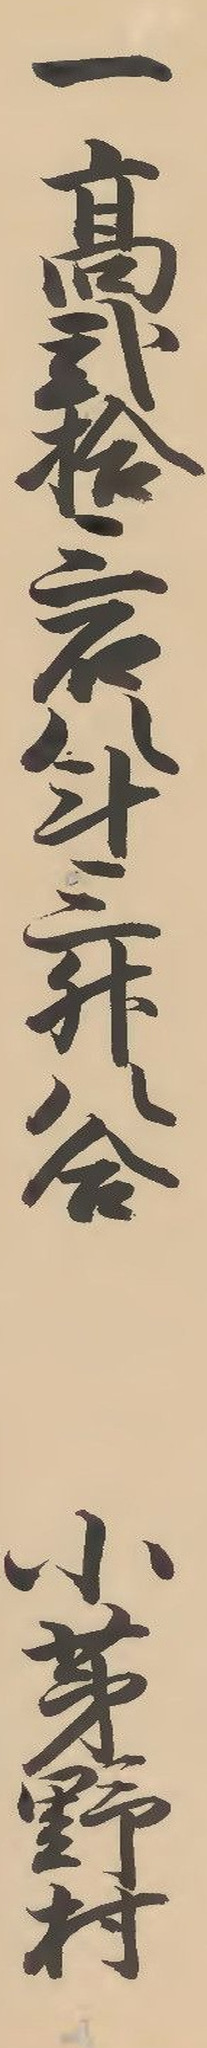一髙弐拾三石八斗三升八合小茅野村
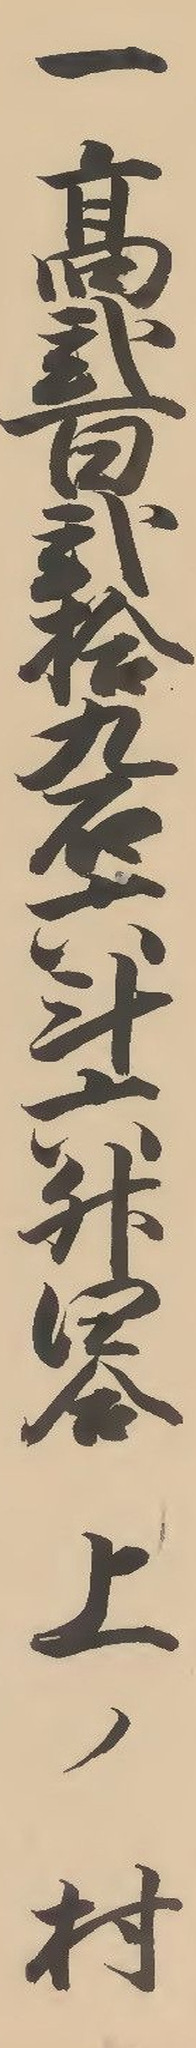一髙弐百弐拾九石六斗六升四合上ノ村
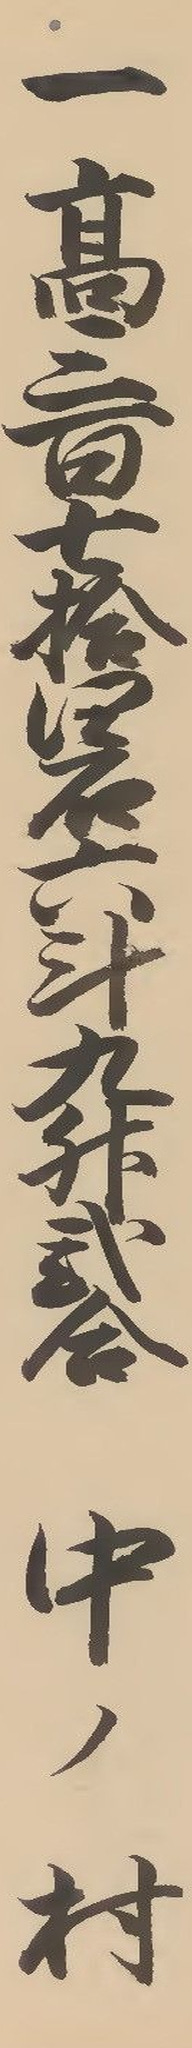一髙三百七拾四石六斗九升弐合中ノ村
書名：播磨国郷帳
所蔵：国立公文書館 National Archives of Japan
